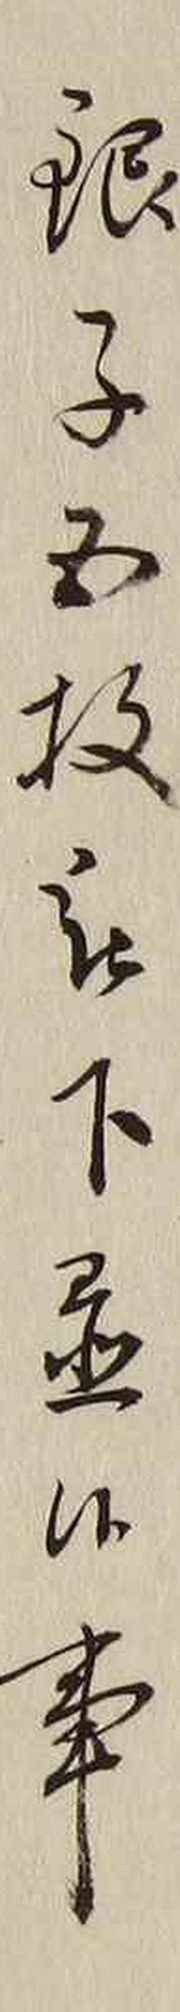銀子五枚被下置候事
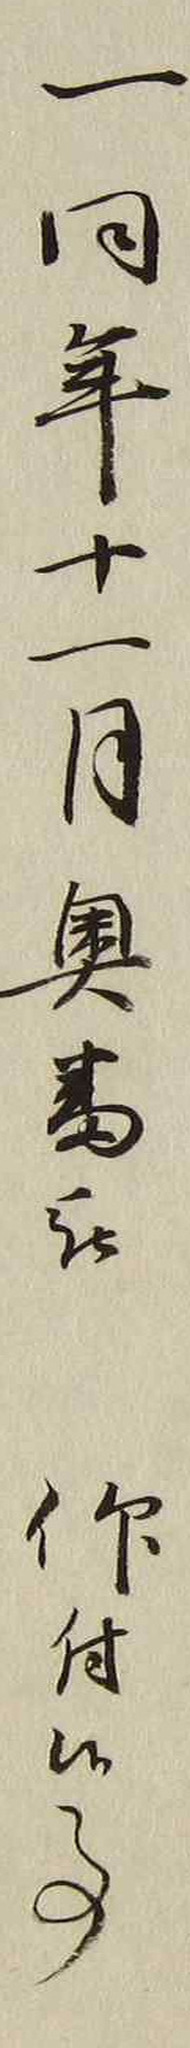一同年十一月奥番被仰付候事
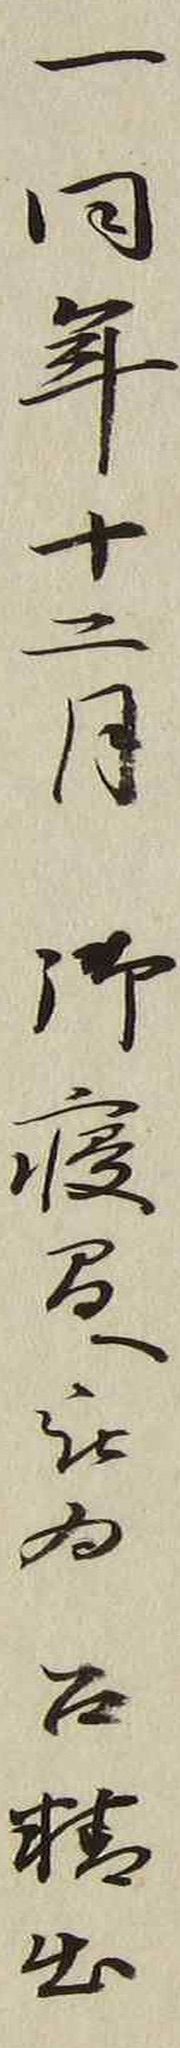一同年十二月御寝間へ被為召精出
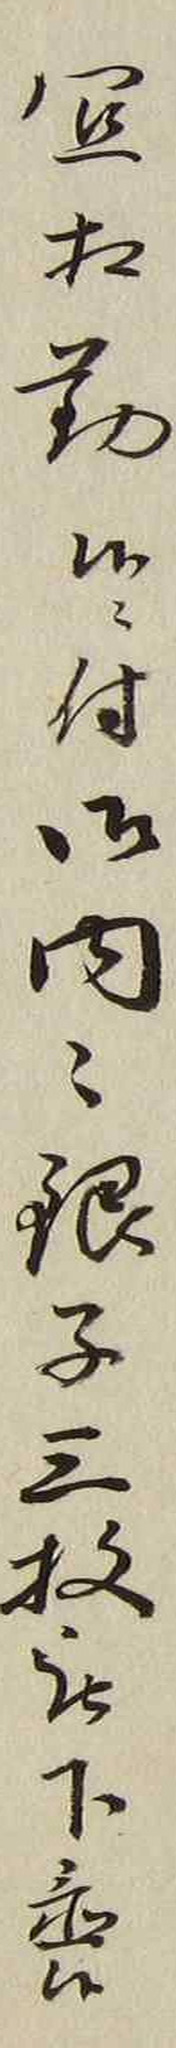宜相勤候ニ付御内々銀子三枚被下置候

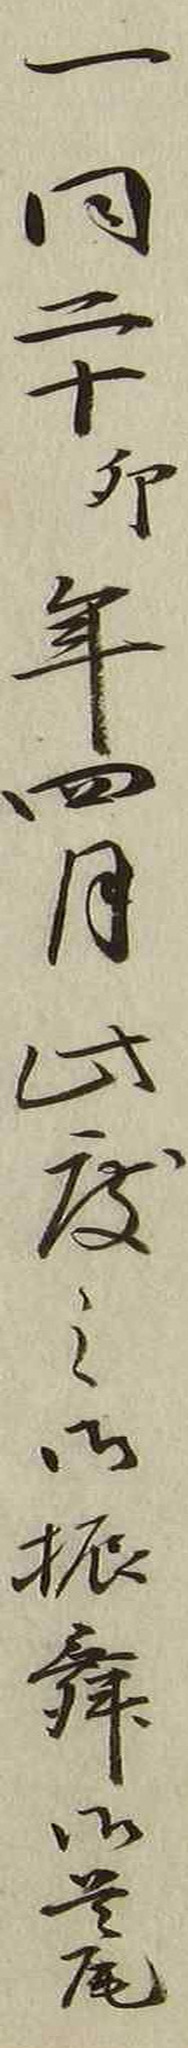一同二十卯四月此度之御振舞御首尾
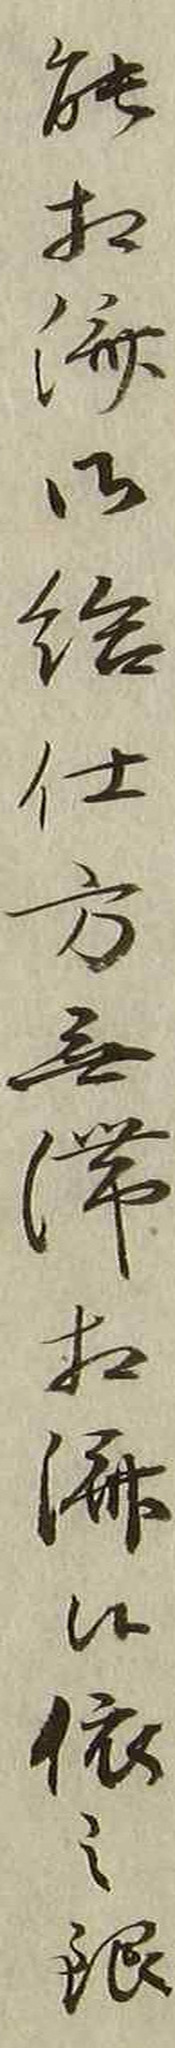能相済御給仕方無滞相済候依之銀
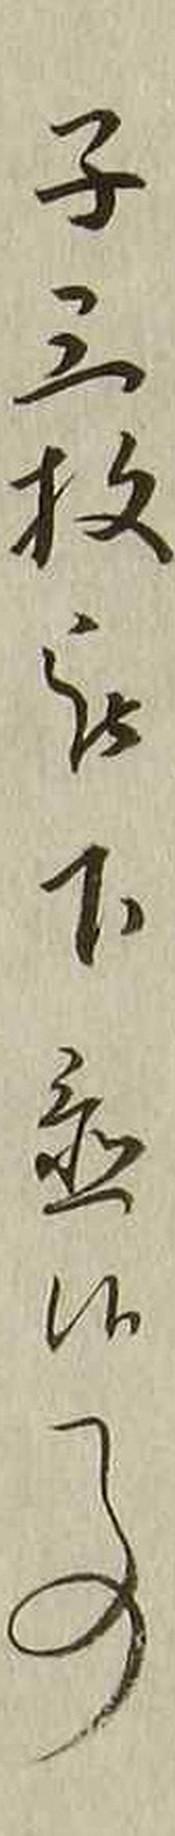子三枚被下置候事
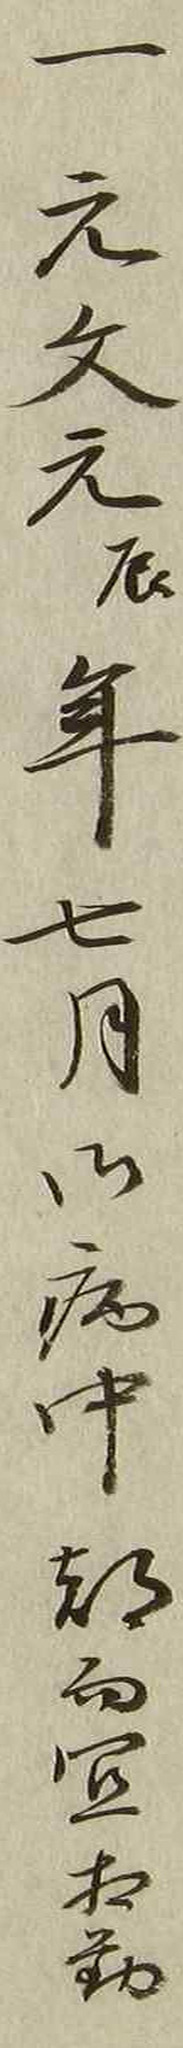一元文元辰年七月御病中都而宜相勤
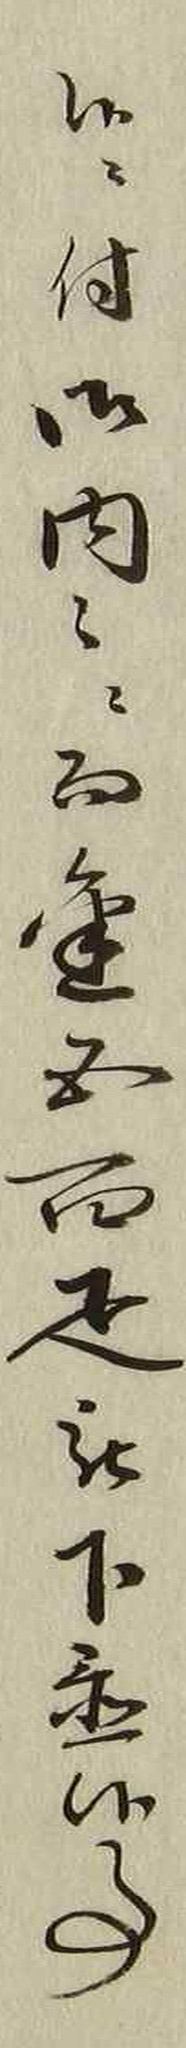候ニ付御内々ニ而金五百疋被下置候事
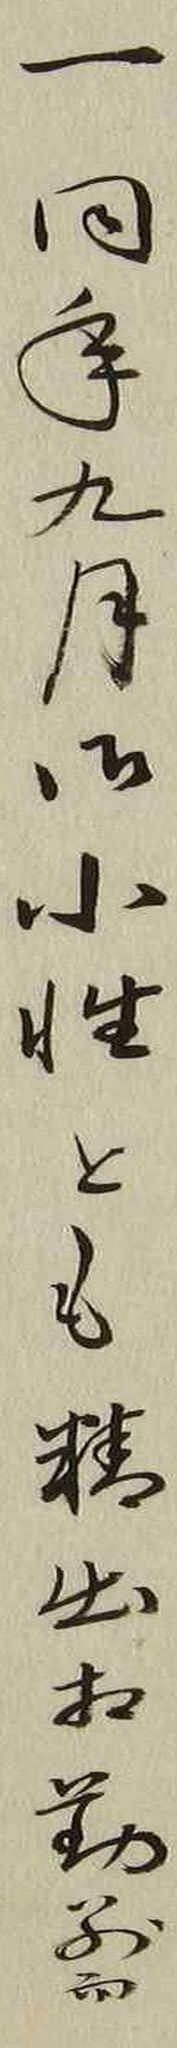一同年九月御小性とも精出相勤別而
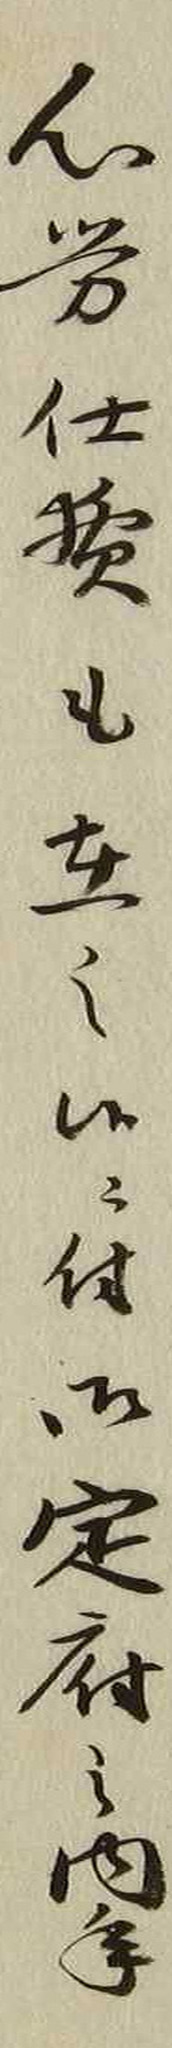心労仕費も在之候ニ付御定府之内年
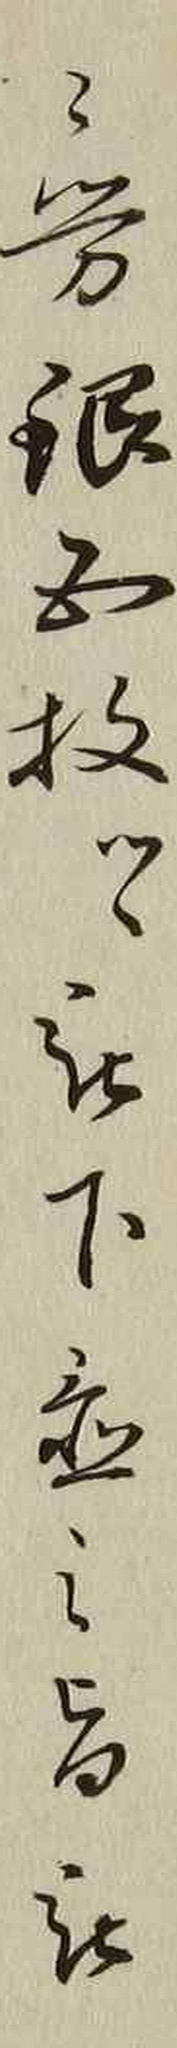々労銀五枚ツ丶被下置之旨被
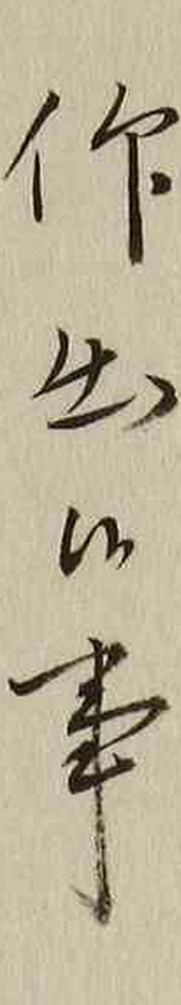仰出候事
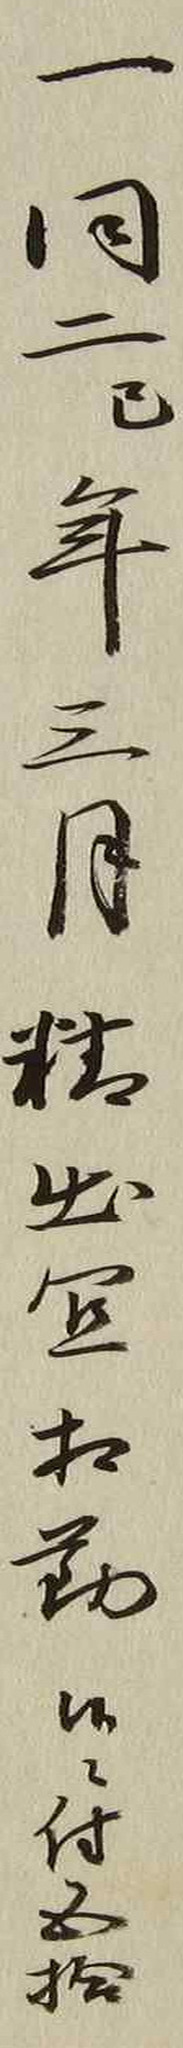一同二巳年三月精出宜相勤候ニ付五拾
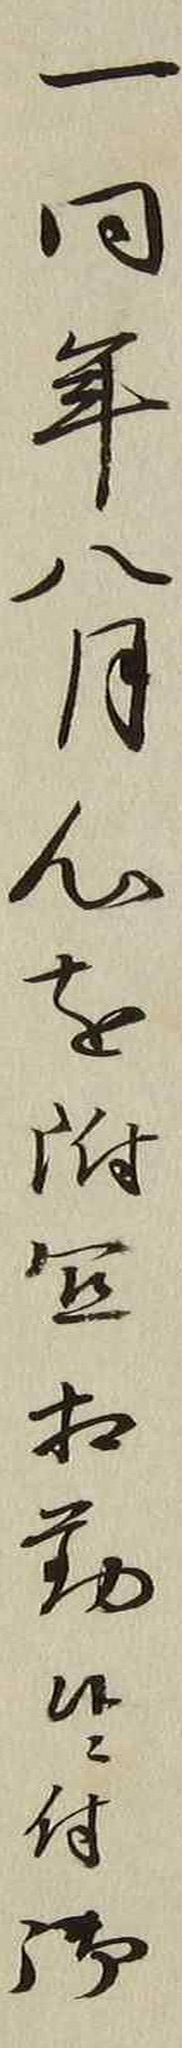一同年八月心を附宜相勤候ニ付御
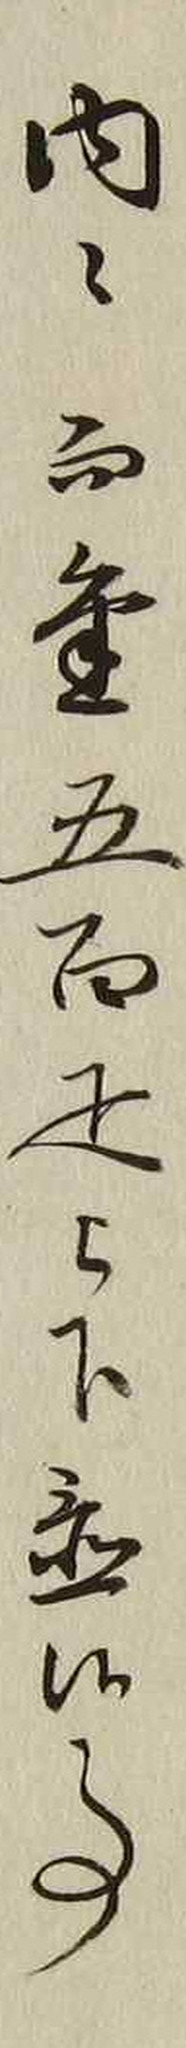内々而金五百疋被下置候事
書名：諸士系譜　巻之19　い之部19
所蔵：会津若松市立会津図書館
